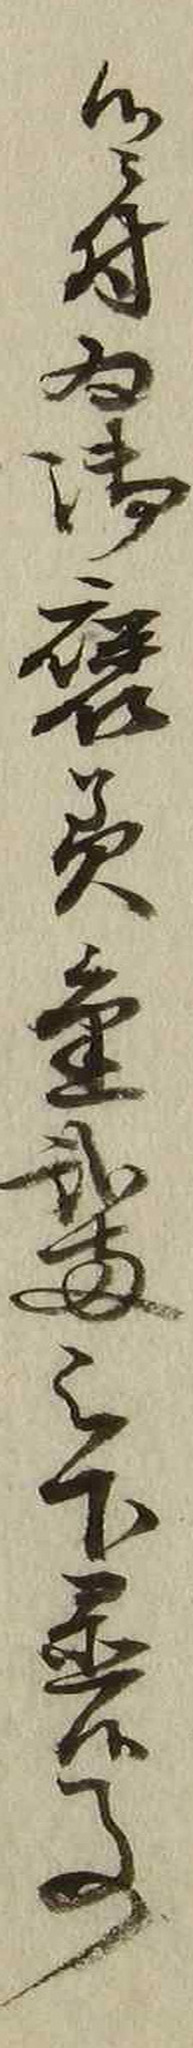候ニ付為御褒美金弐両被下置候事
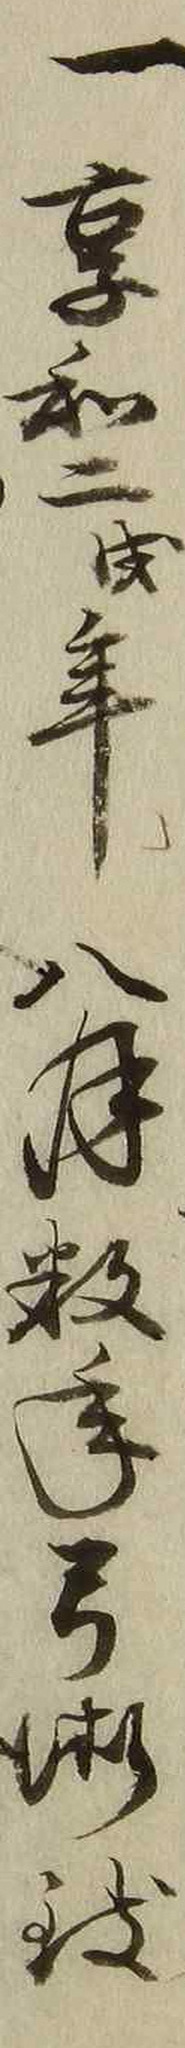一享和二戌年八月数年弓術致
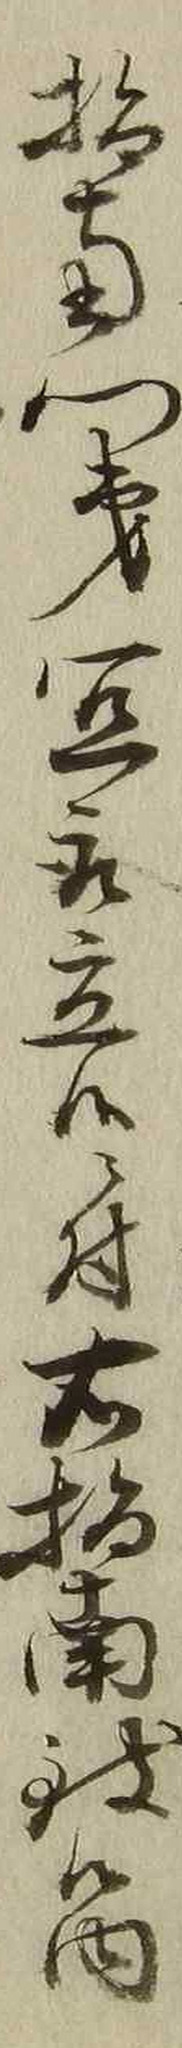指南門弟宜取立候ニ付右指南致候内
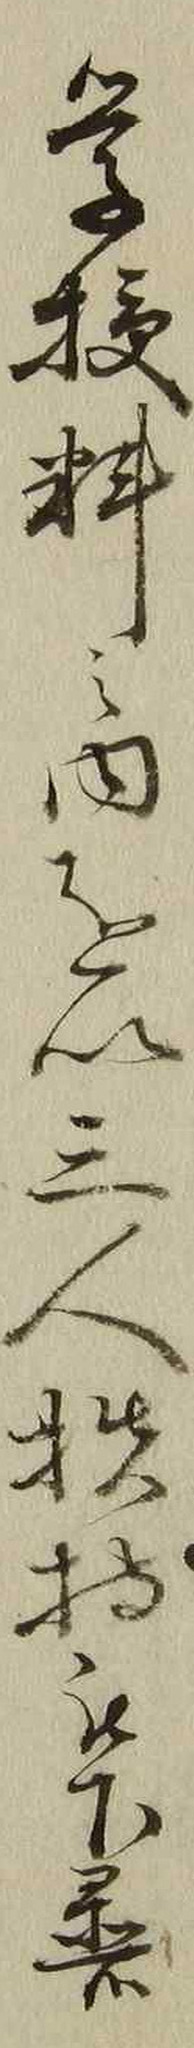学授料之内を以三人扶持被下置候
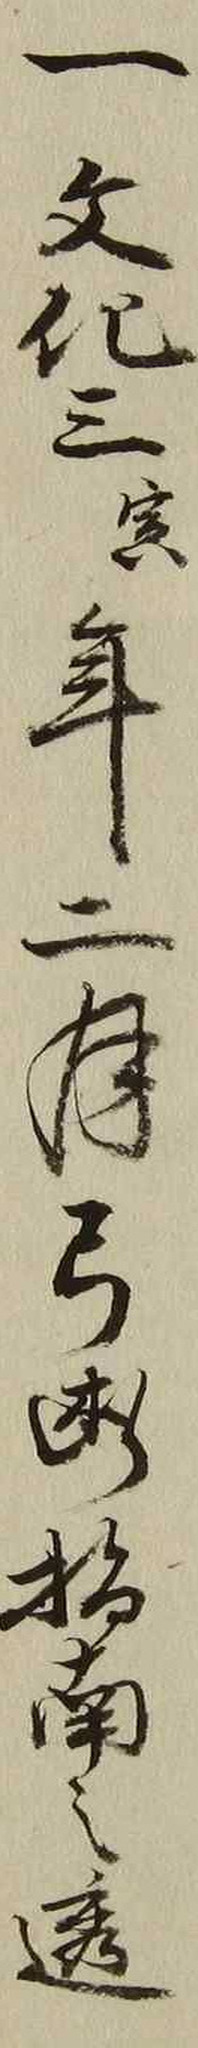一文化三寅年二月弓術指南之透
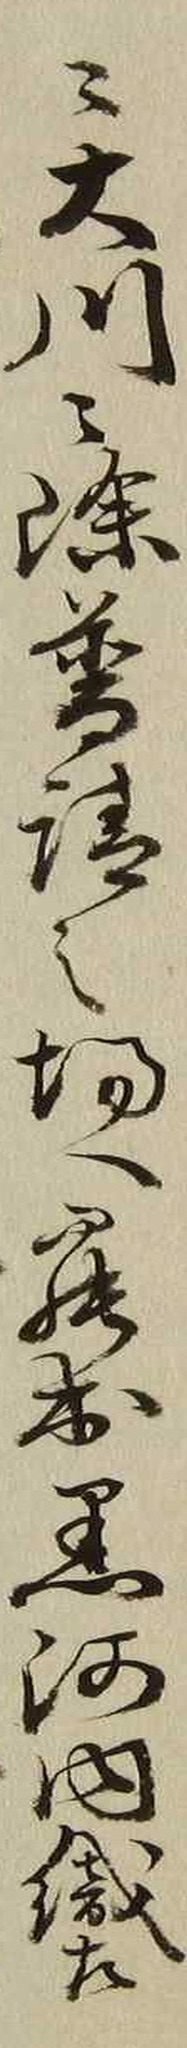々大川々除普請之場へ罷出黒河内織左
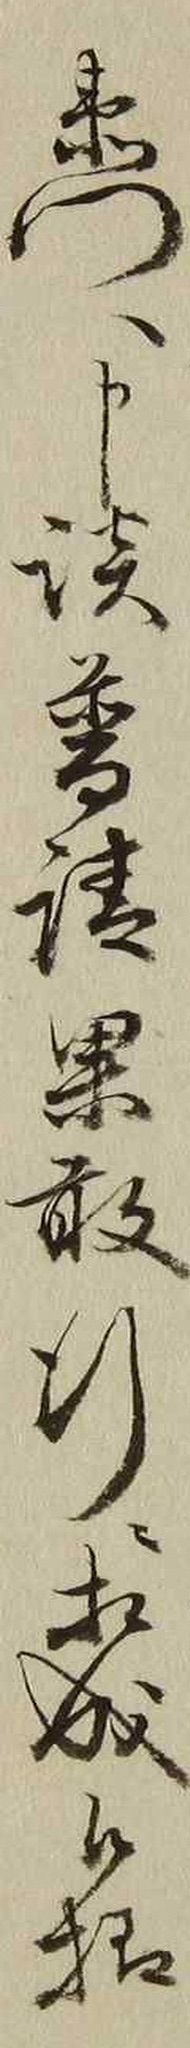衛門へ申談普請果敢行ニ相成候様
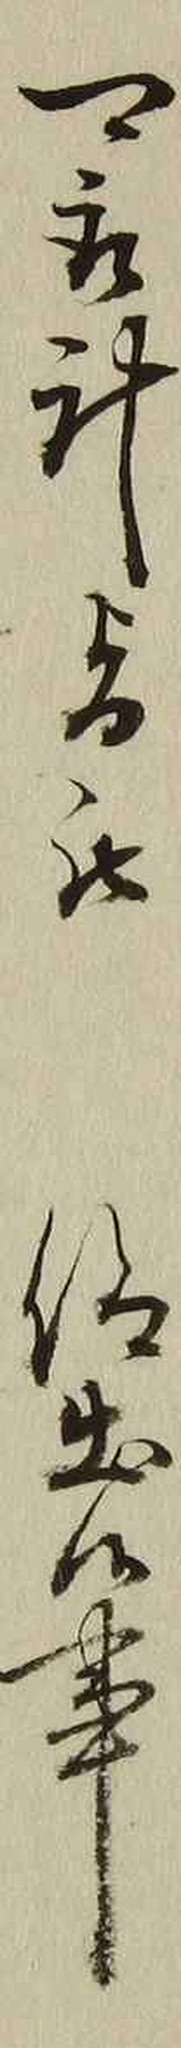可取計旨被仰出候事
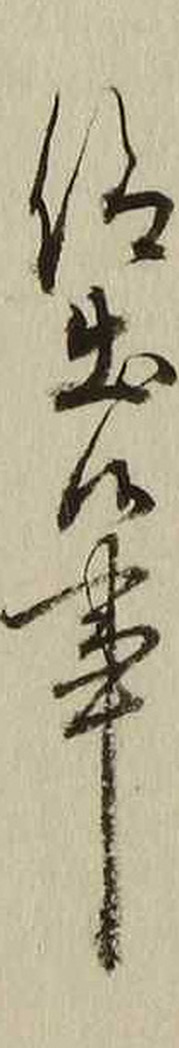仰付候事
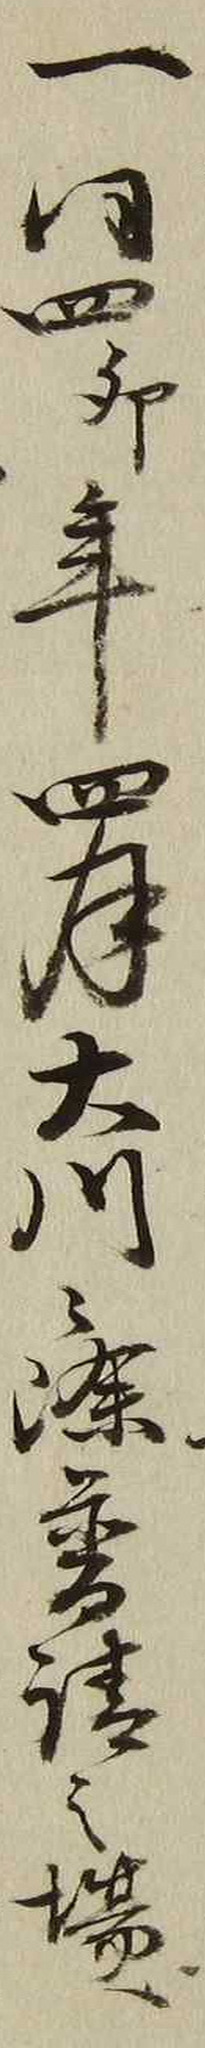一同四卯年月四大川々除普請之場へ
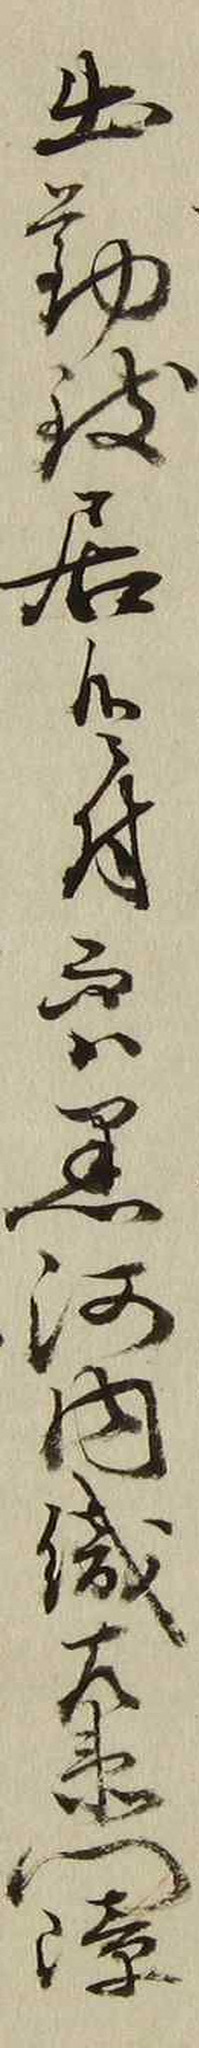出勤致居候ニ付而ハ黒河内織左衛門障
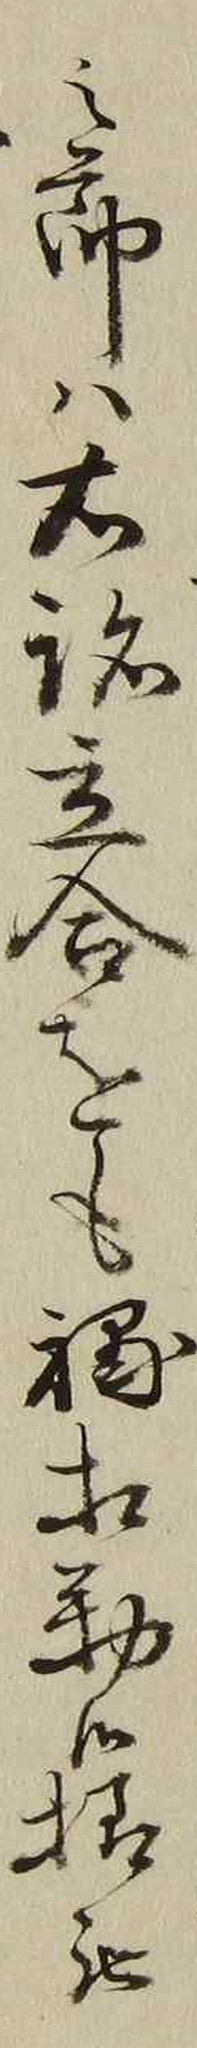之節ハ右跡立合をも補相勤候様被
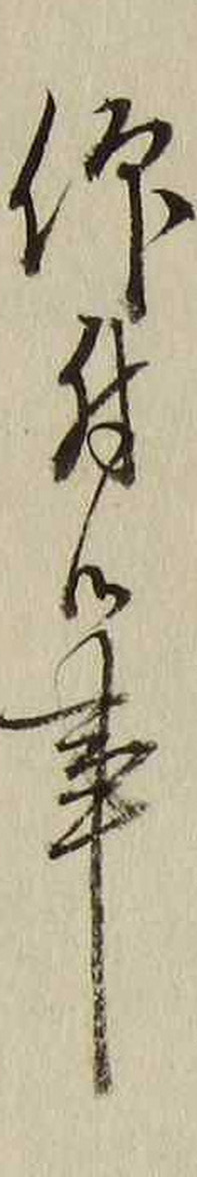仰付候事
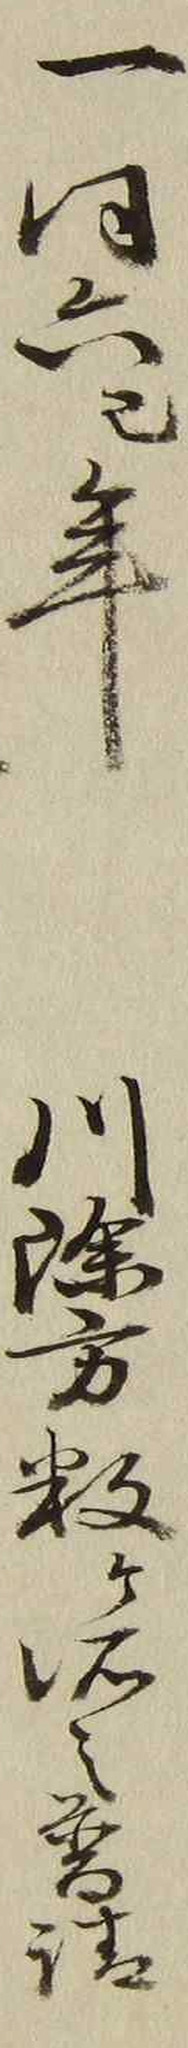一同六巳年川除方数ヶ所之普請
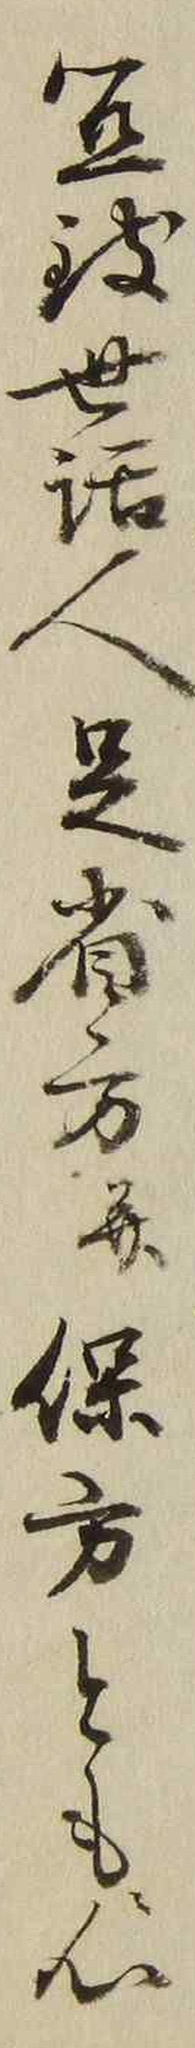宜致世話人足省方并保方ともニ心

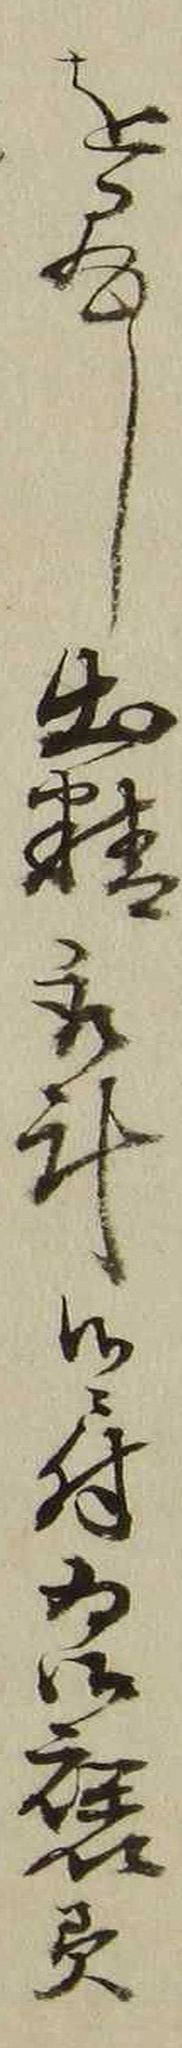を尽し出精取計候ニ付為御褒美
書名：諸士系譜　巻之36　は之部4
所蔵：会津若松市立会津図書館
